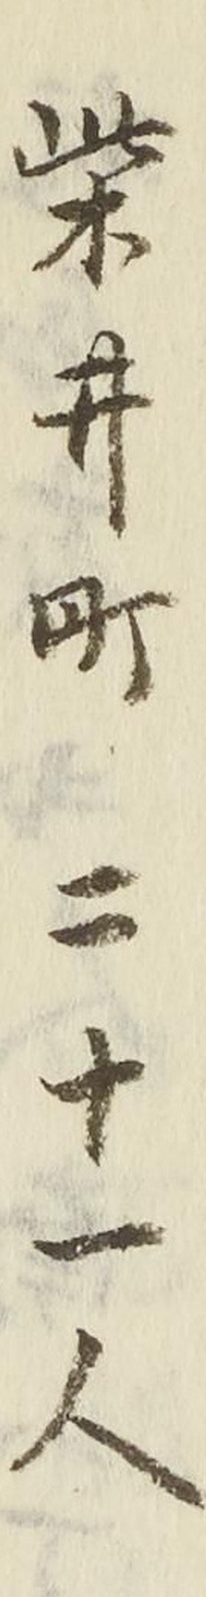柴井町二十一人
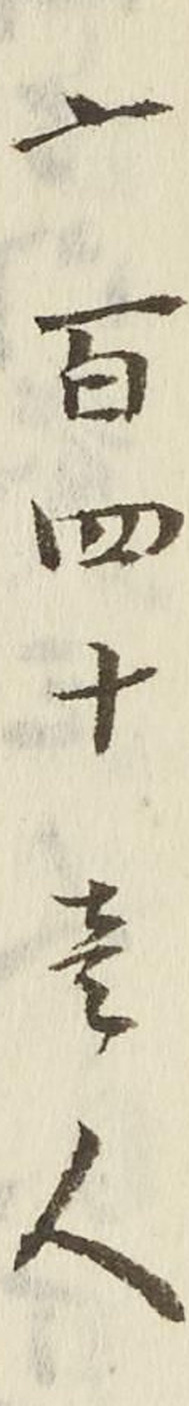〆百四十壱人
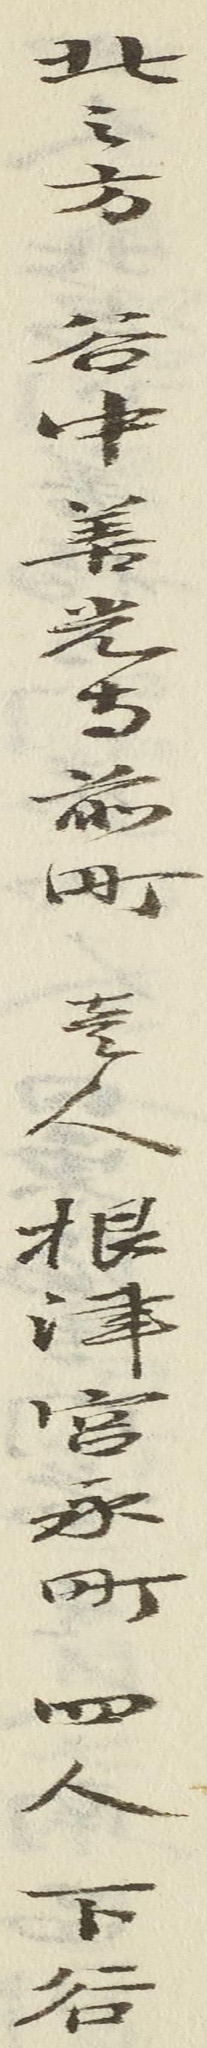北之方谷中善光寺前町壱人根津富永町四人下谷
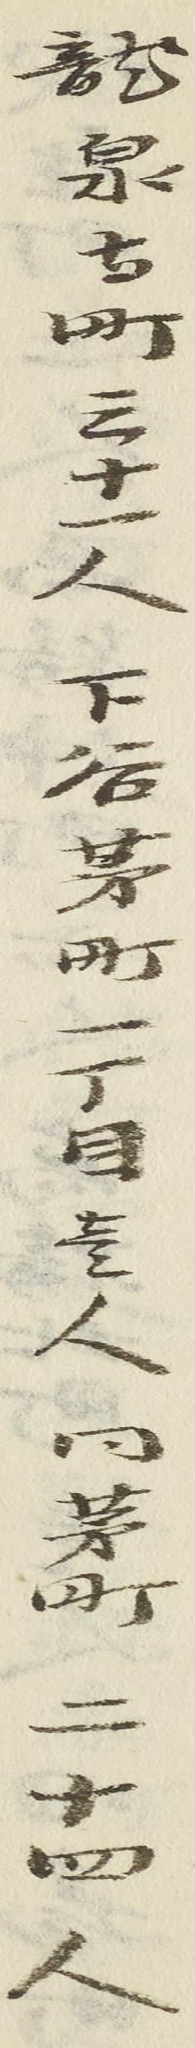龍泉寺町三十一人下谷茅町一丁目壱人同茅町二十四人
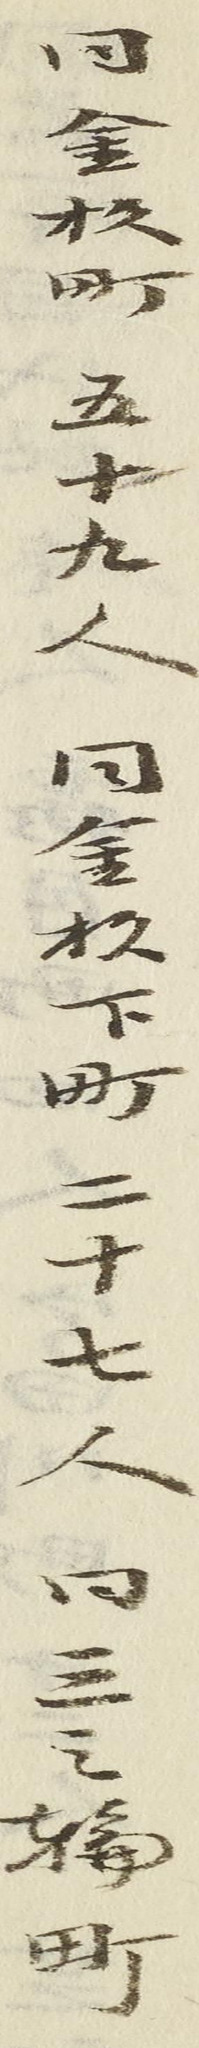同金杉町五十九人同金杉下町二十七人同三之輪町
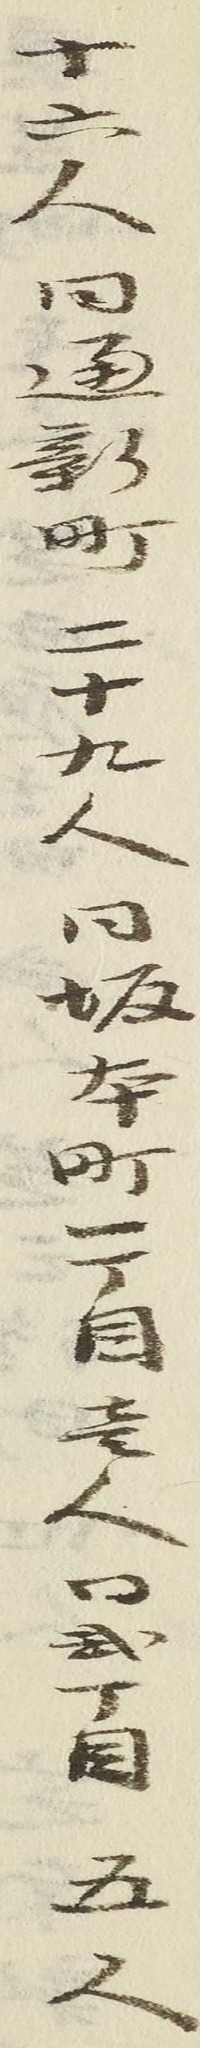十六人同通新町二十九人同坂本町一丁目壱人同弐丁目五人
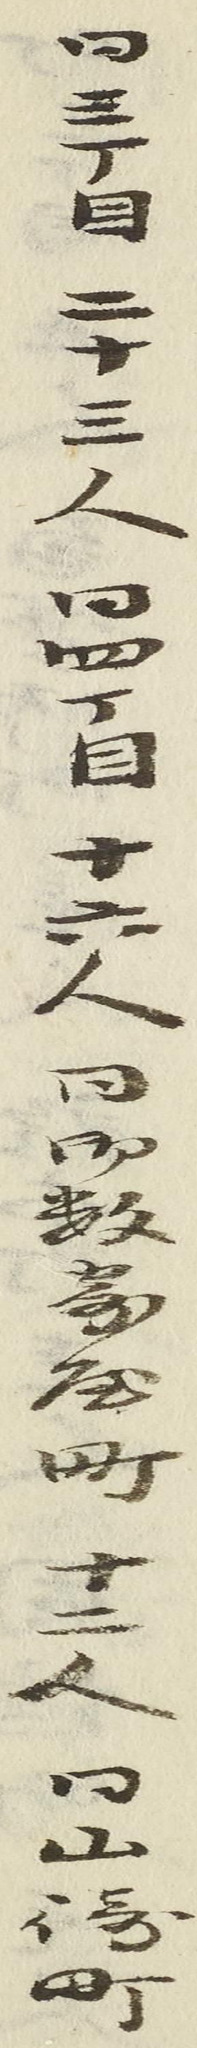同三丁目二十三人同四丁目十六人同御数寄屋町十二人同山崎町
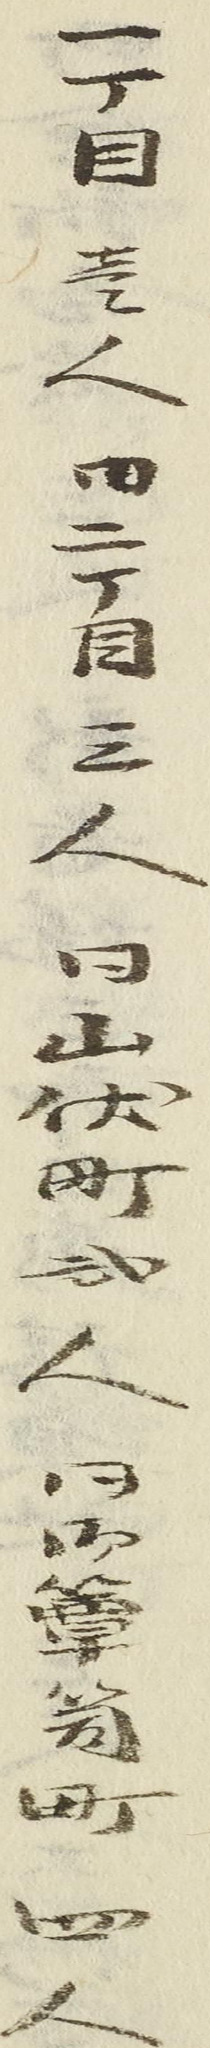一丁壱人同二丁目三人同山伏町弐人同御箪笥町四人
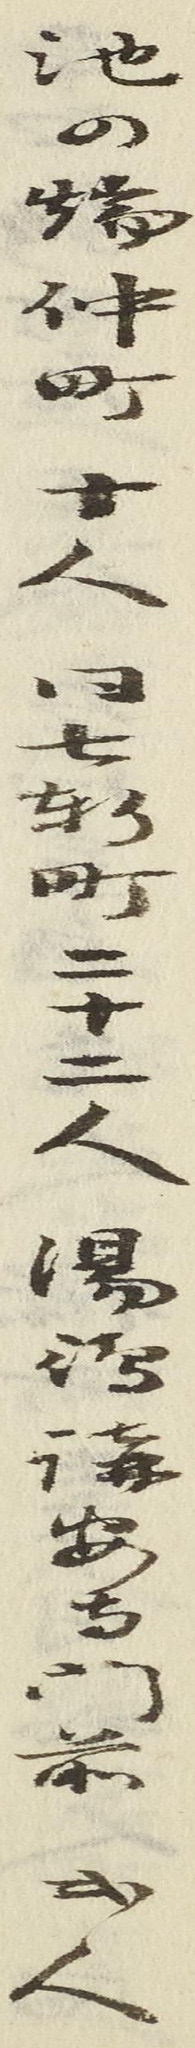池の端仲町十人同七軒町二十二人湯嶋講安寺門前弐人
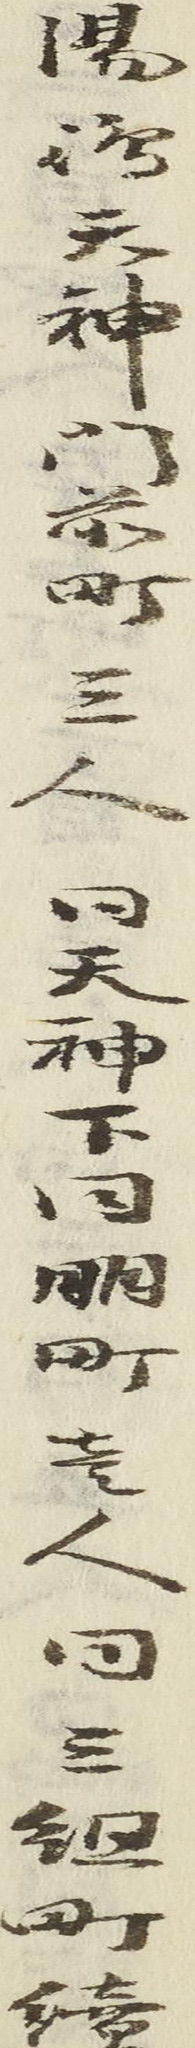湯嶋天神門前町三人同天神下同朋町壱人同三組町続
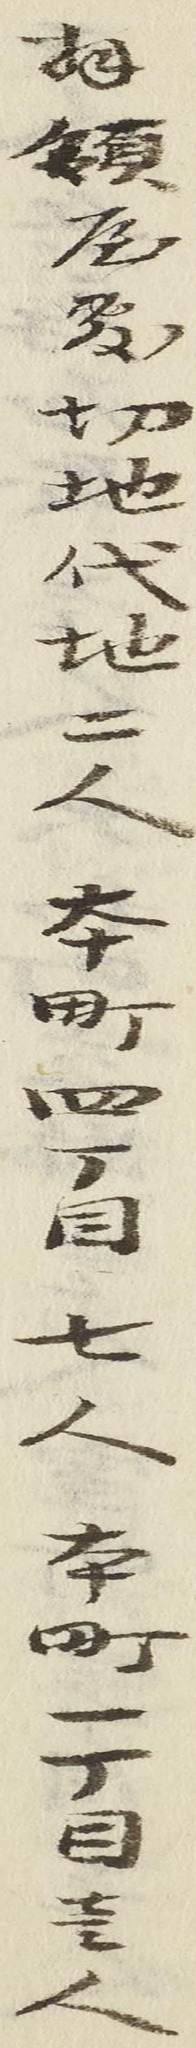拝領地屋敷切地代地二人本町四丁目七人本町一丁目一人
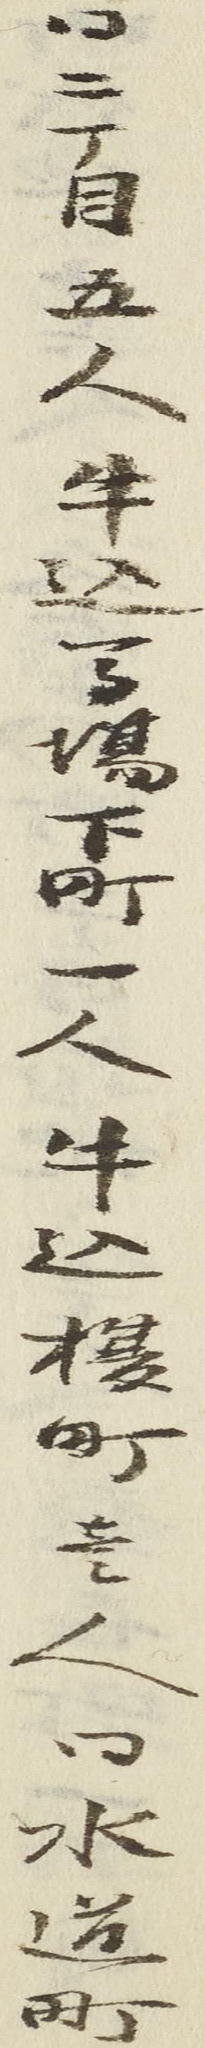同二丁目五人牛込馬場下町一人牛込榎町壱人同水道町
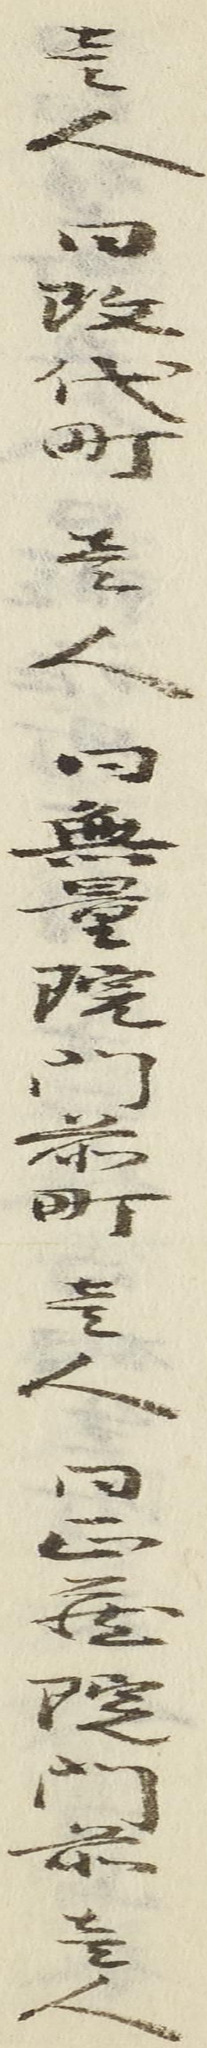壱人同改代町壱人同無量院門前町壱人同正蔵院門前壱人
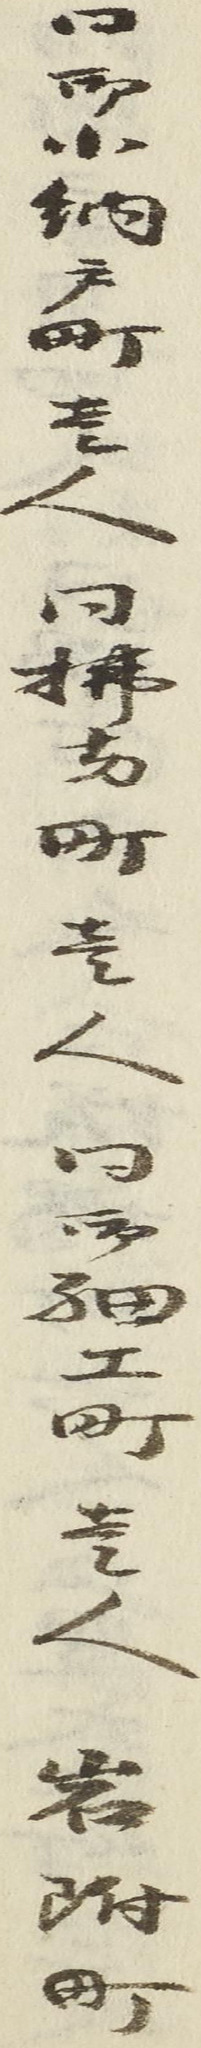同御納戸町壱人同拂方町壱人同御細工町壱人岩附町
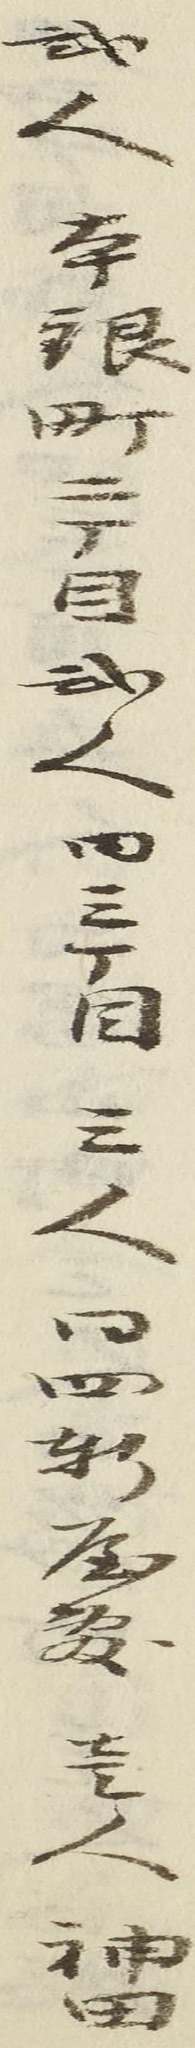弐人本銀町二丁目弐人同三丁目三人同四軒屋敷壱人勘だ
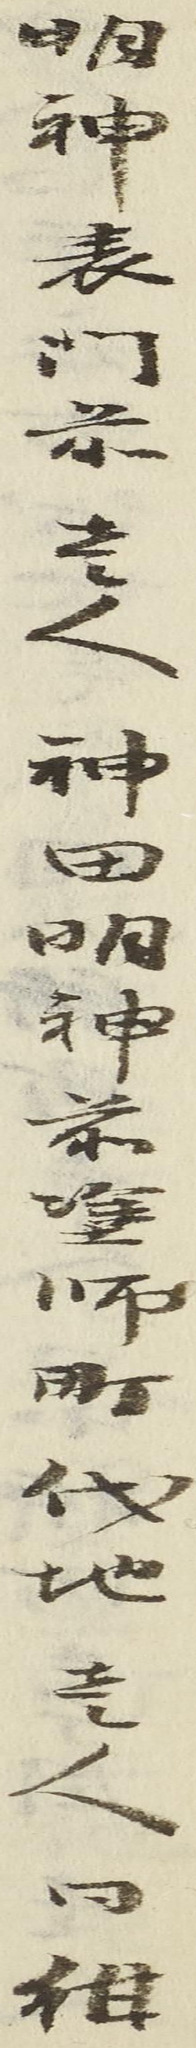明神表門前壱人神田明神前塗師町代地壱人同紺
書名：那為の後見艸　全
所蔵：東京大学地震研究所図書室 Earthquake Research Institute Library, The University of Tokyo, JAPAN
